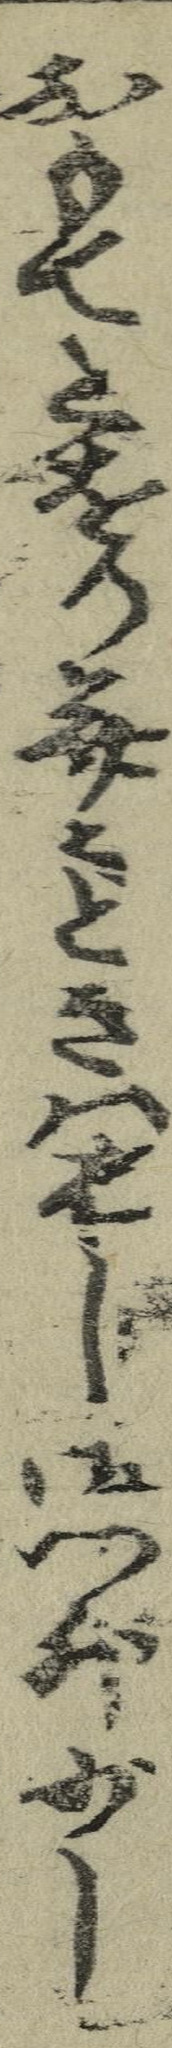おもてとをり并にときははし御門外少し
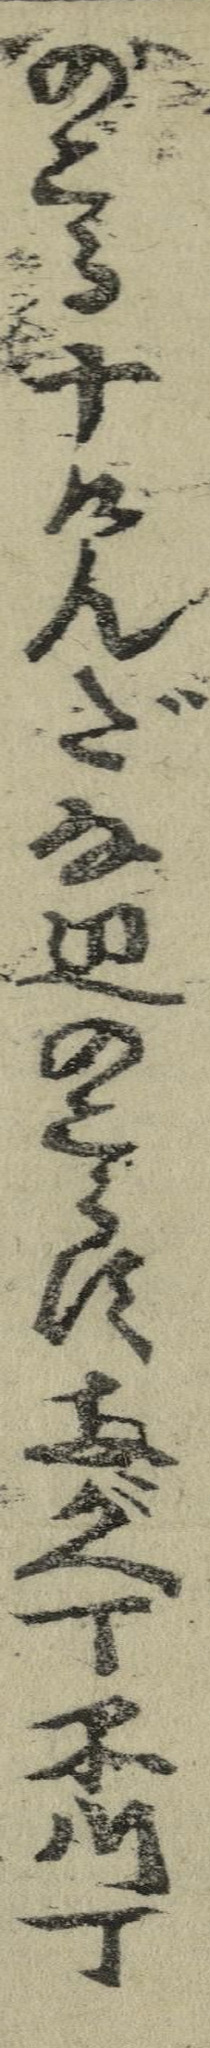のこる十けんだな辺のこらず兩がへ丁品川丁
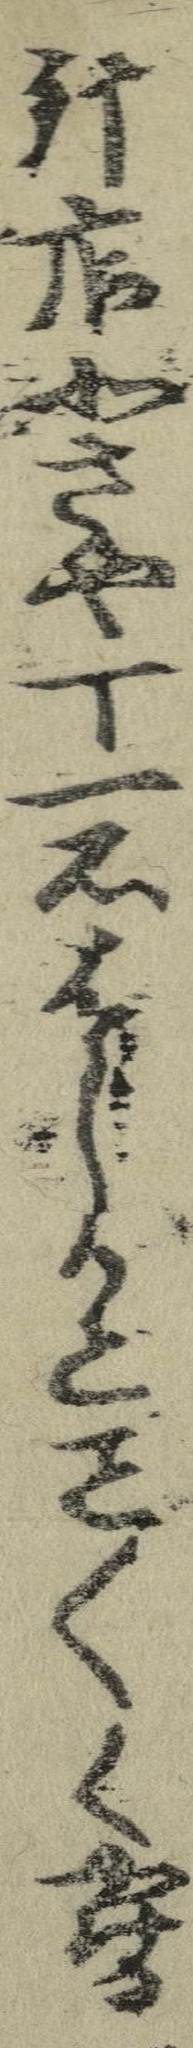針店北さや丁一石はしかとこと〴〵くやける
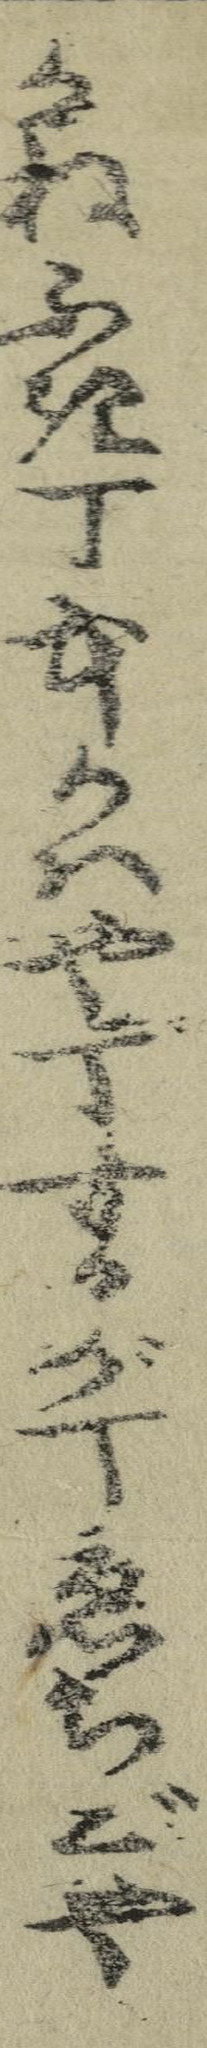かねふき丁本かはや丁するが丁ゑちごや
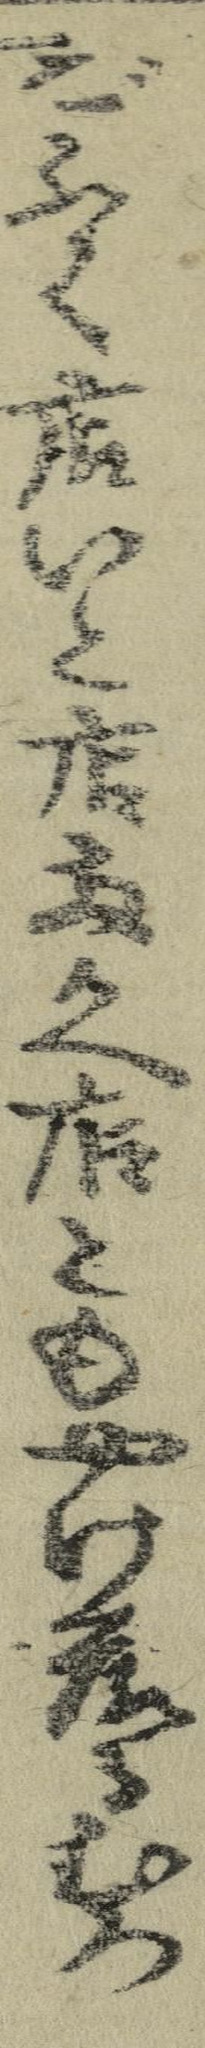ごふく店いと店兩かへ店ともやけ落るむろ
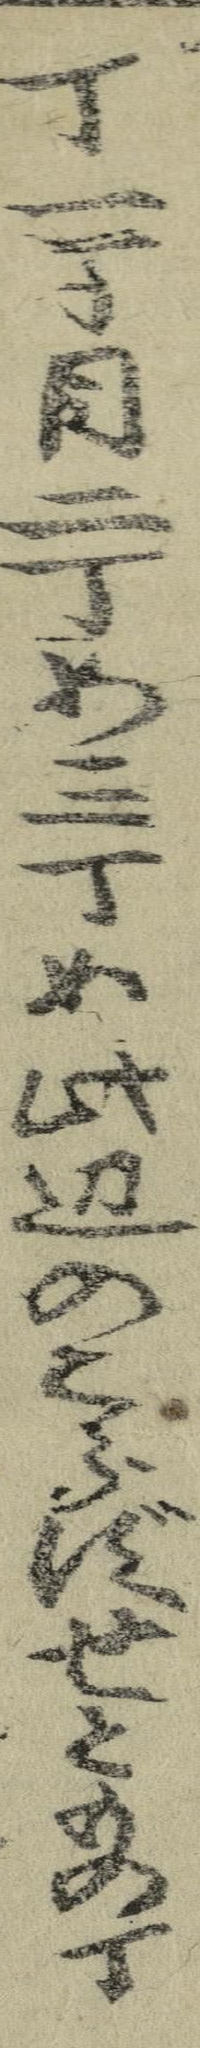丁一丁目二丁目三丁め此辺のこらずせともの丁
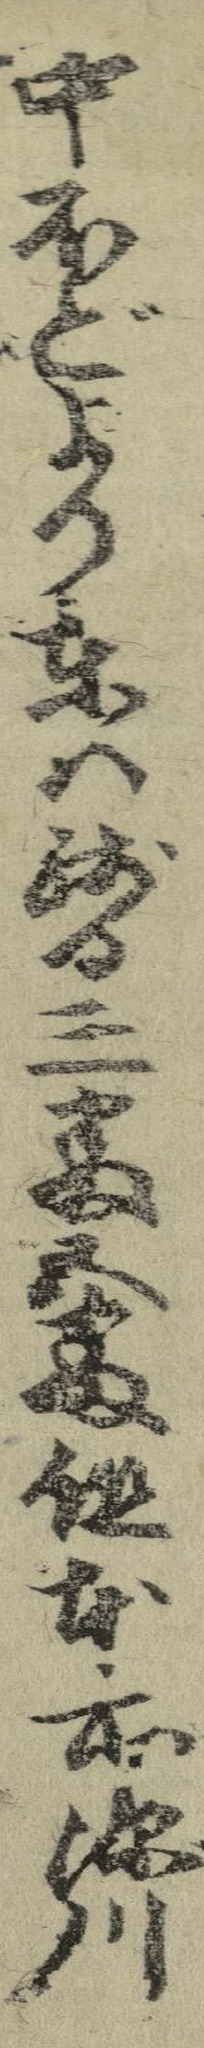中ほどより東は残る三番五番組本所深川
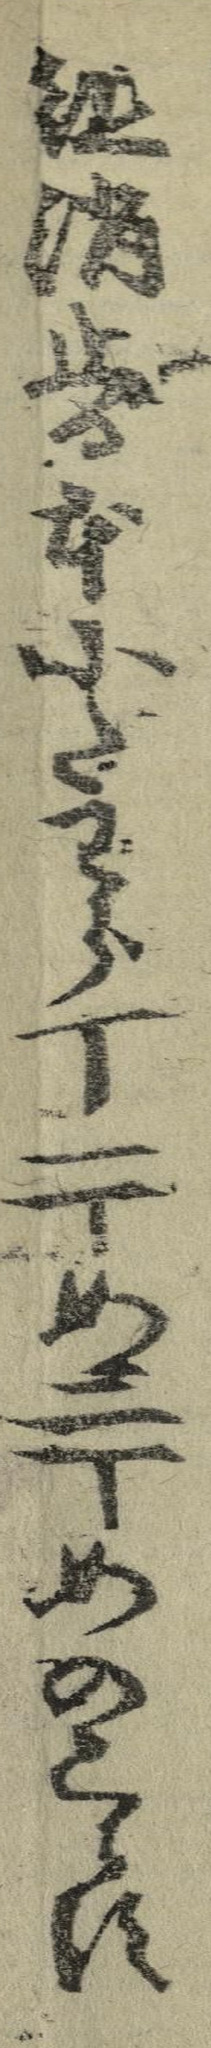組消止る本小だわら丁一丁め二丁めのこらす
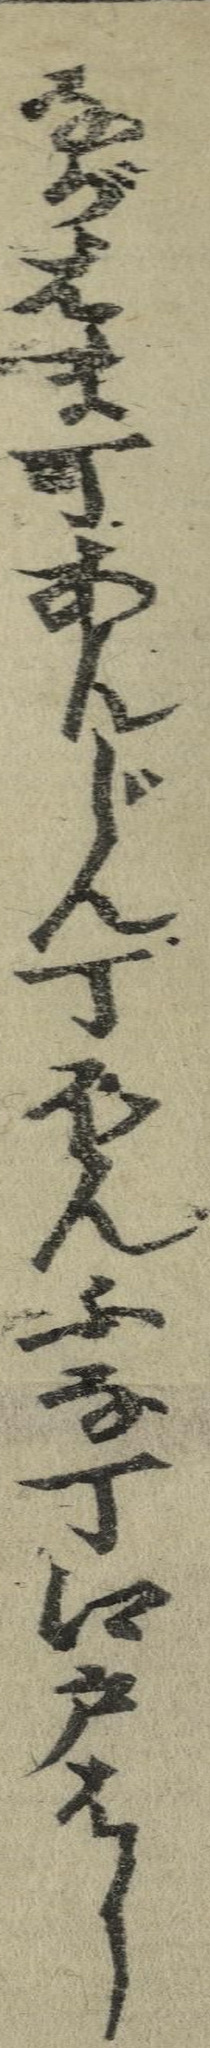ながはま丁あんじん丁ほんふな丁江戸はし
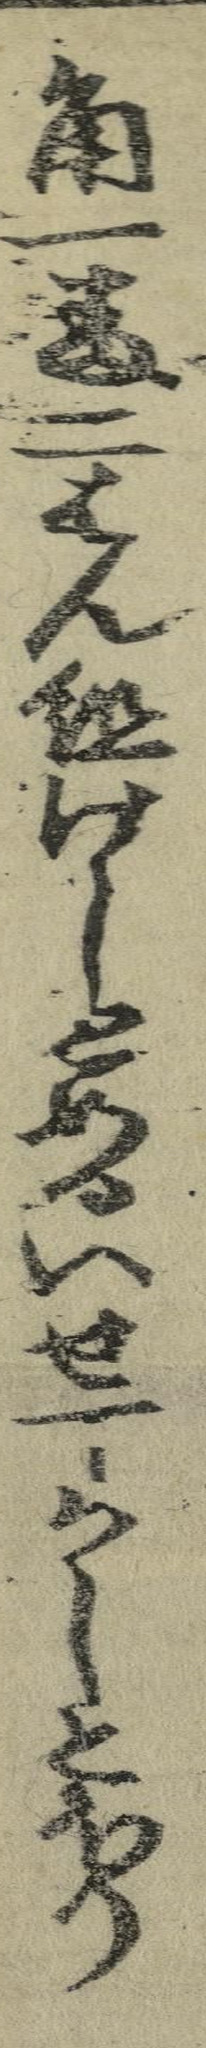角一番二はん組けしとめるいせ丁かしとほり
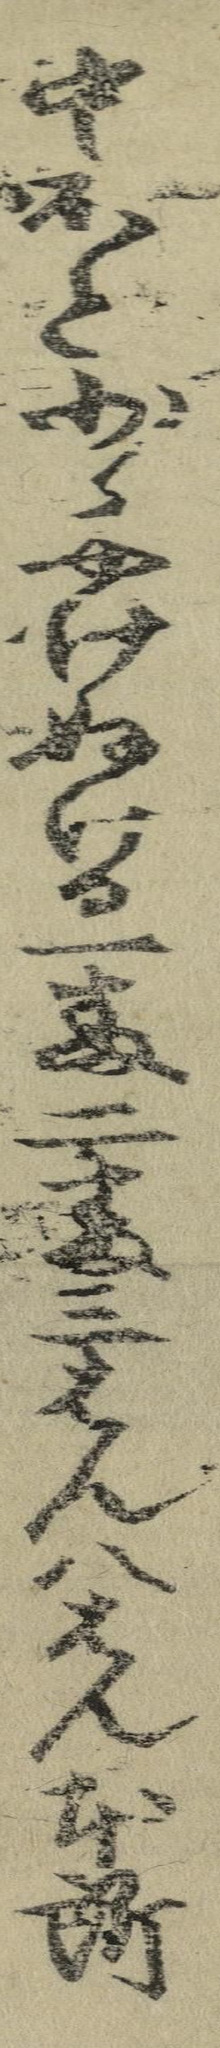中ほど少々やけぬける一番二番三はん八はん本所
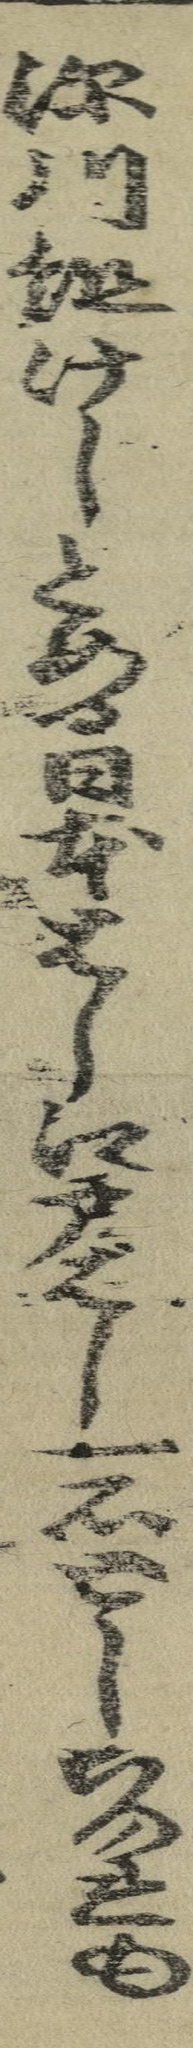深川組けしとめる日本はし江戸ばし一石はしいつれも
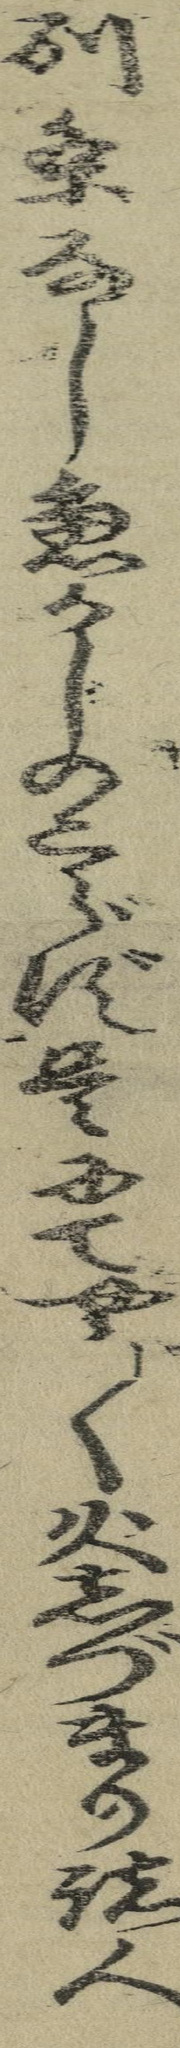別条なし魚かしのこらず是にてやう〳〵火しづまり諸人
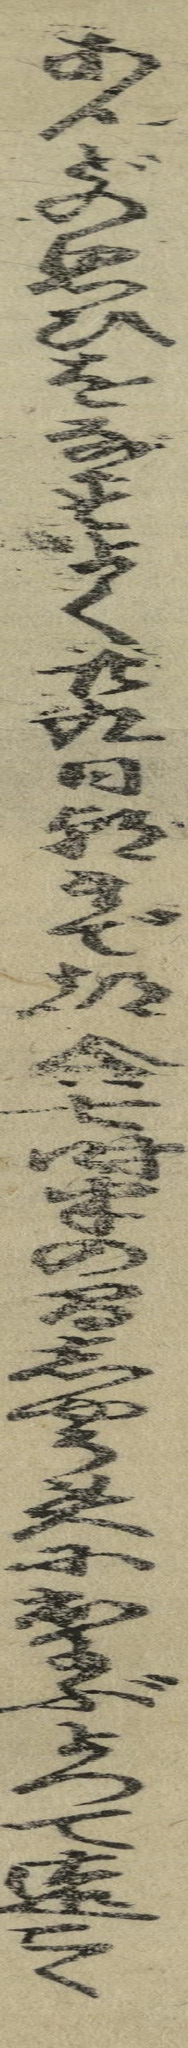あんどの思ひをなすよく廿九日朝まで都合七時半の間しやうしつにおよぶよつて遠国
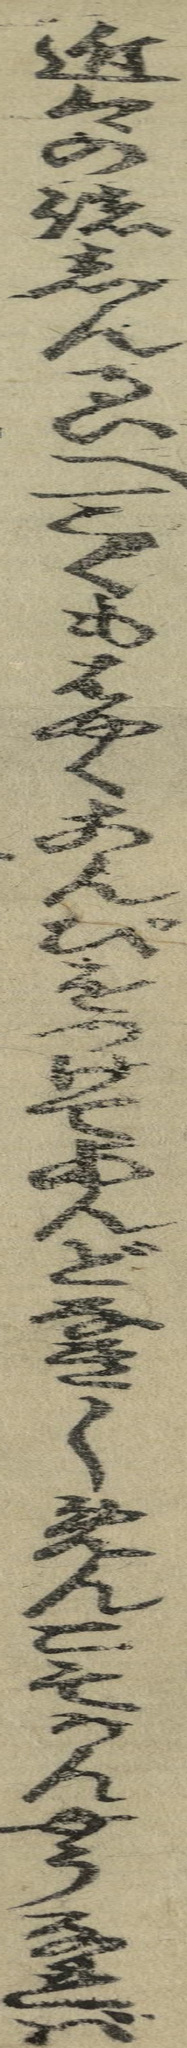近郷の諸しんるいへ一こくもはやくあんぴをつげてあんどなきくめんこそかんやうなれば
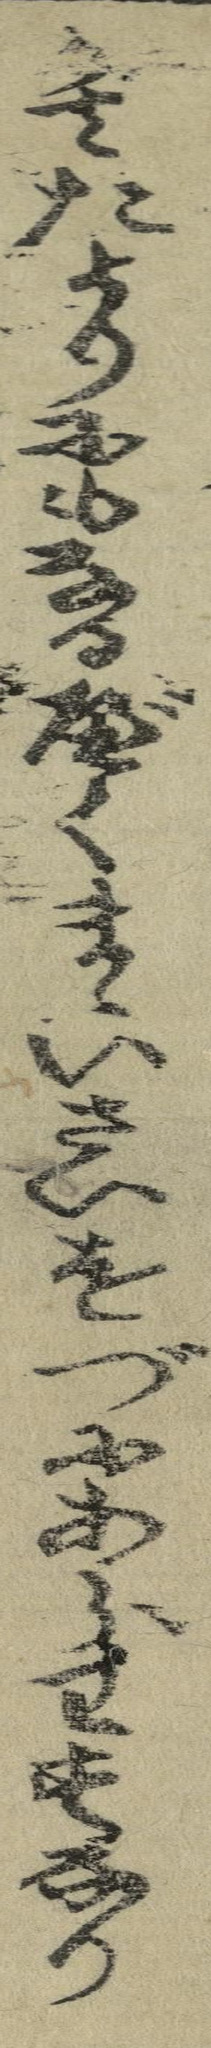其たよりにもなるべくまたいさいをづにあらわすなり
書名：[安政元年十二月の江戸大火に関する瓦版]
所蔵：東京大学地震研究所図書室 Earthquake Research Institute Library, The University of Tokyo, JAPAN
